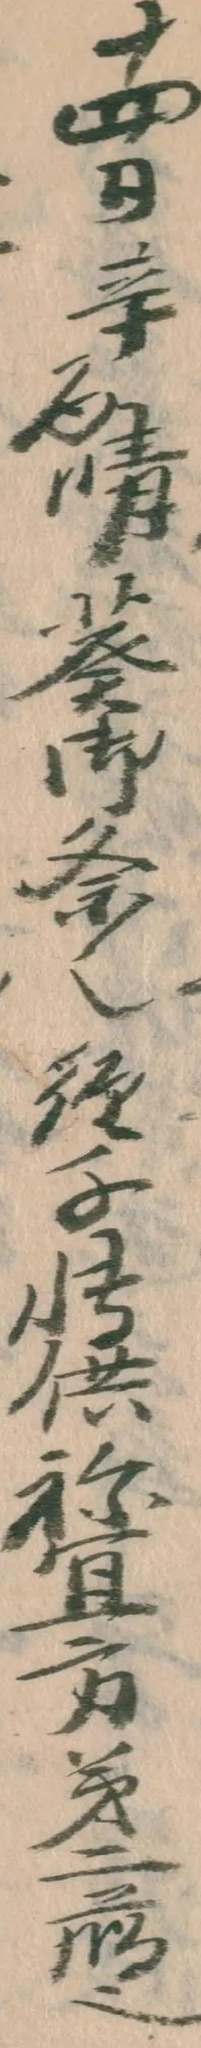十四日辛酉晴葵御祭也経千轉供称宜方第二臈也
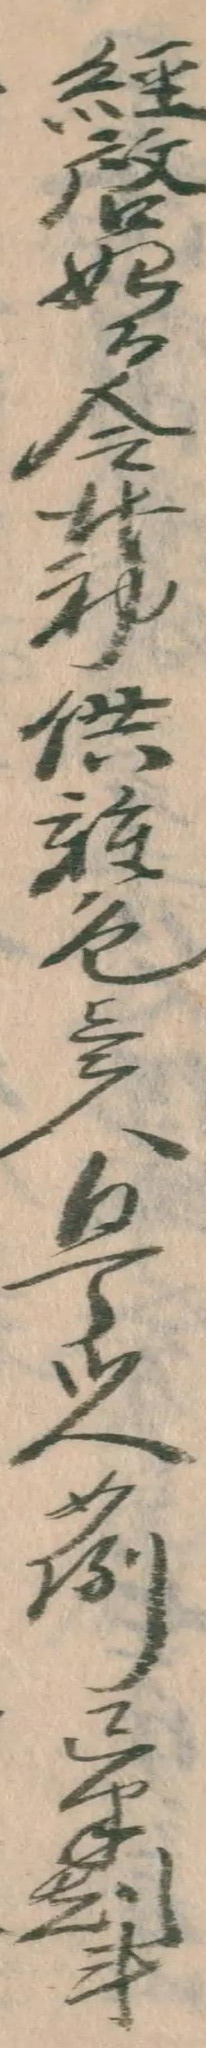経啓始而令代勤供雑色壱人白丁弐人如例巳半刻斗
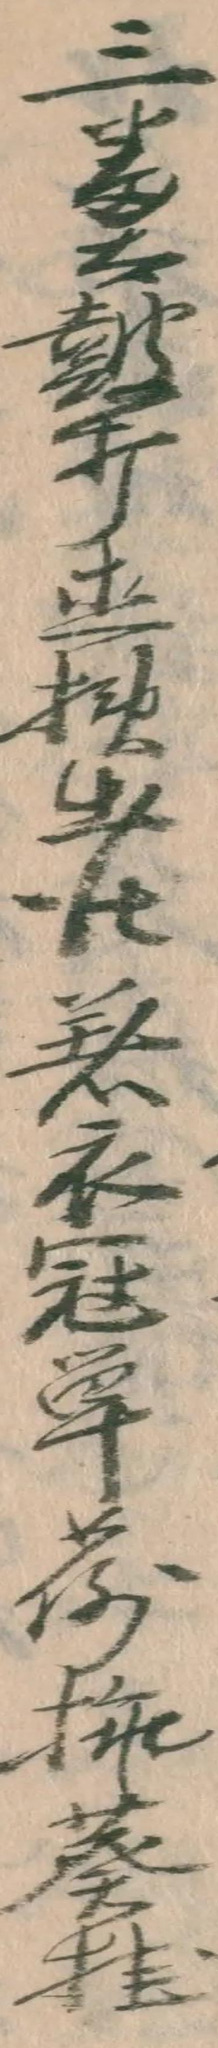三番太皷打直様出仕着衣冠単如例挿葵桂
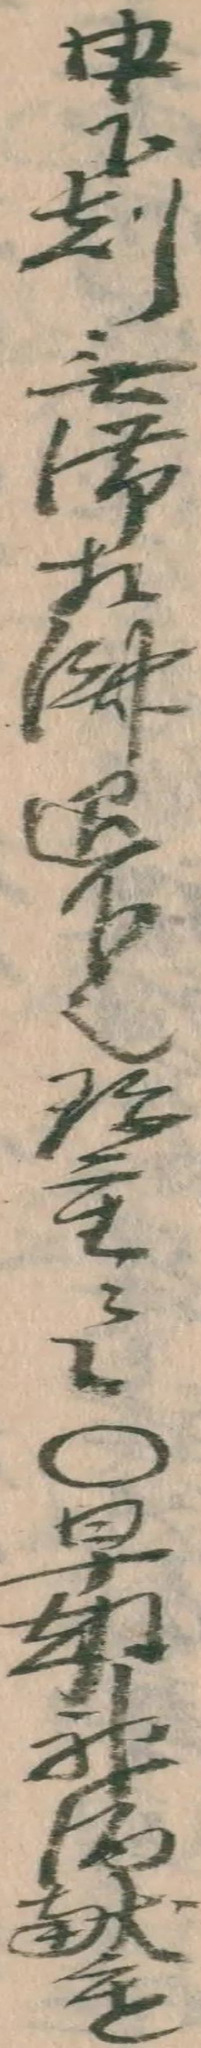申下刻無滞相済退下之珍重々々〇早朝神酒献進
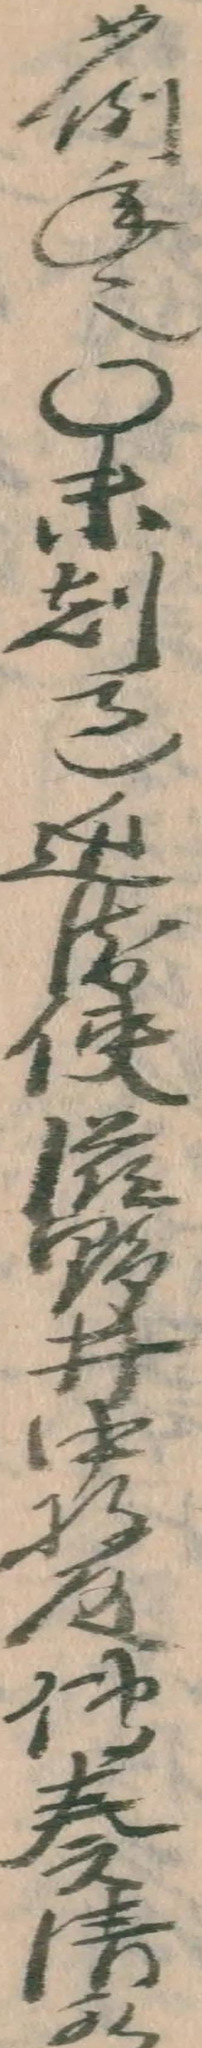如例年也○未刻過近衛使滋野井中将殿傳奏清水
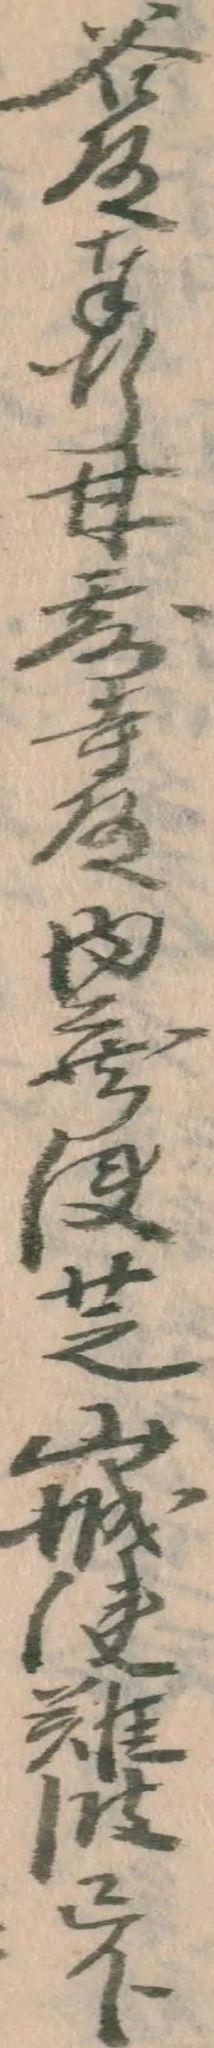谷殿奉行甘露寺殿内蔵使芝山城使難波已下
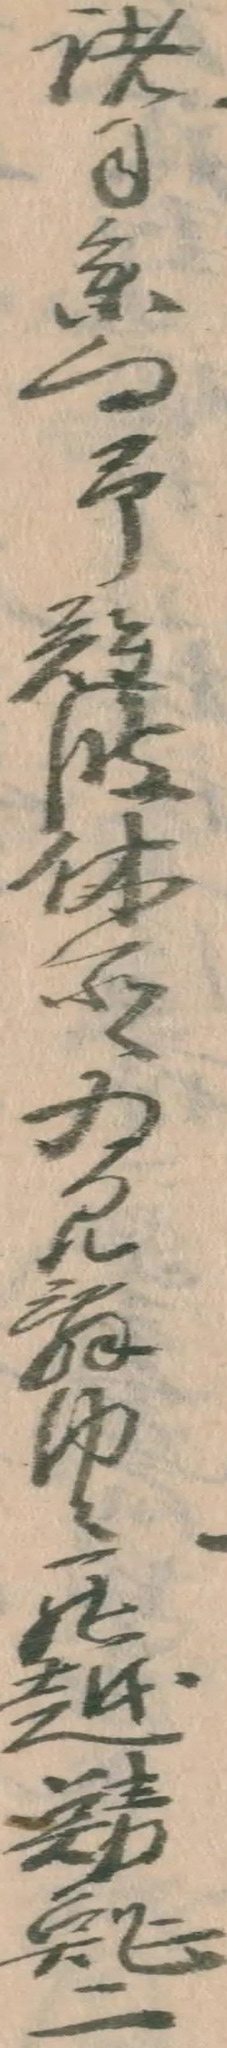諸司参向予難波休所へ為見舞申候罷越鯖飛魚二
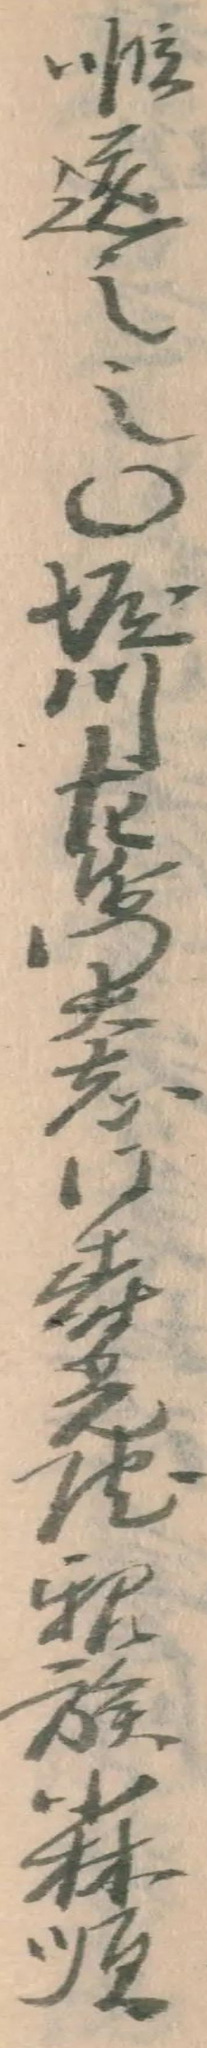喉送之也○堀川左衛門大志同寿光院親族小林順
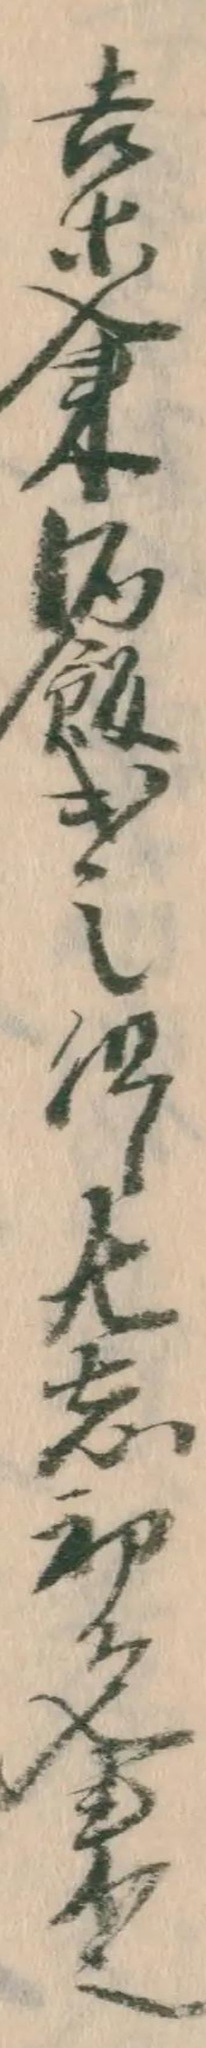吉等入来酒飯出之但し大志初而入来也
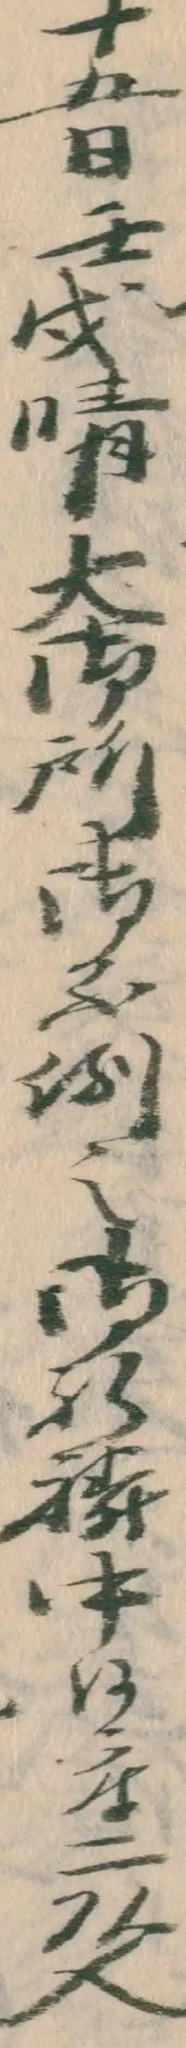十五日壬戌晴大御所御不例之御祈祷中日ニ付二頭人
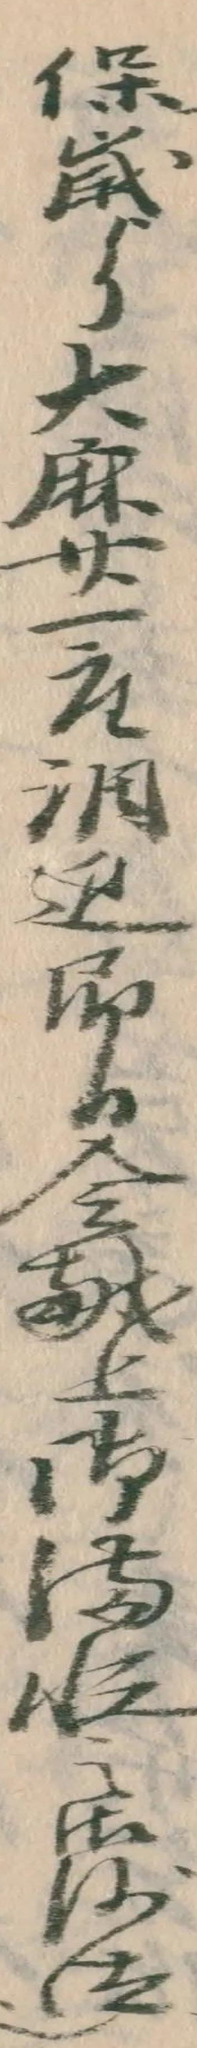保歳より大麻廿一座調進即日令献上御満悦之御沙汰
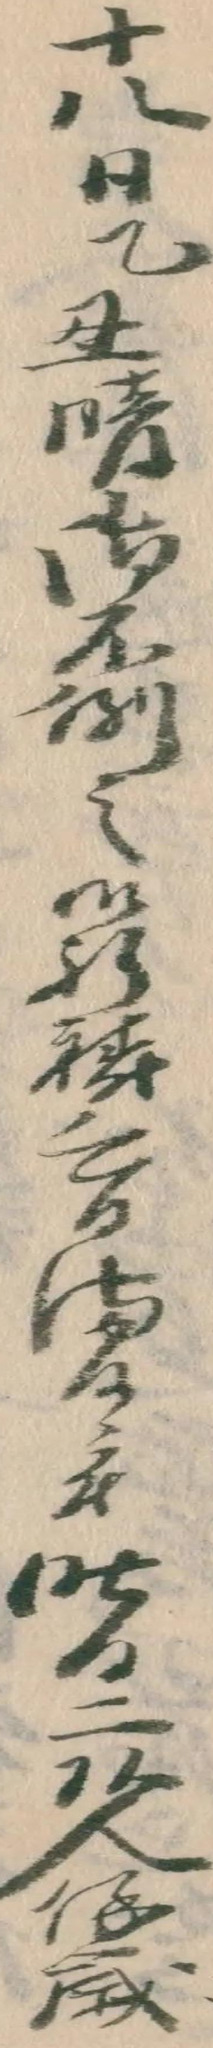十八日乙丑晴御不例之御祈祷今日満日ニ付昨日二頭人縁歳
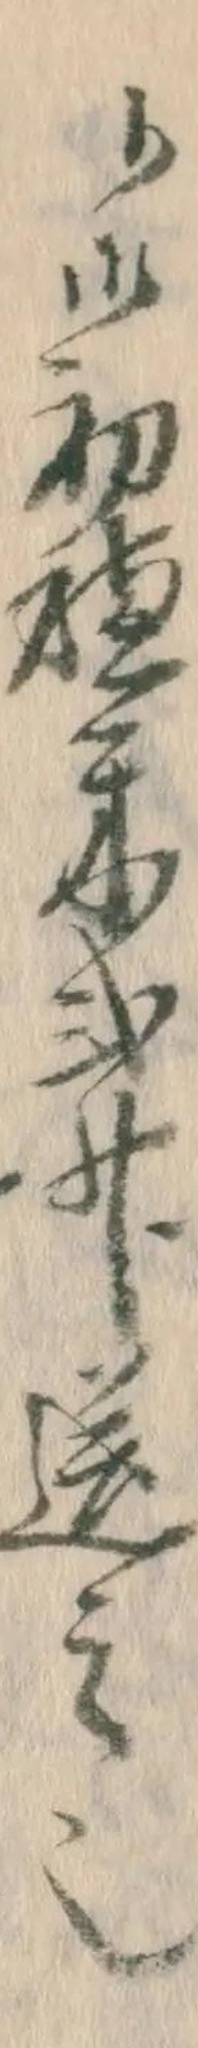え御初穂米弐升送之也
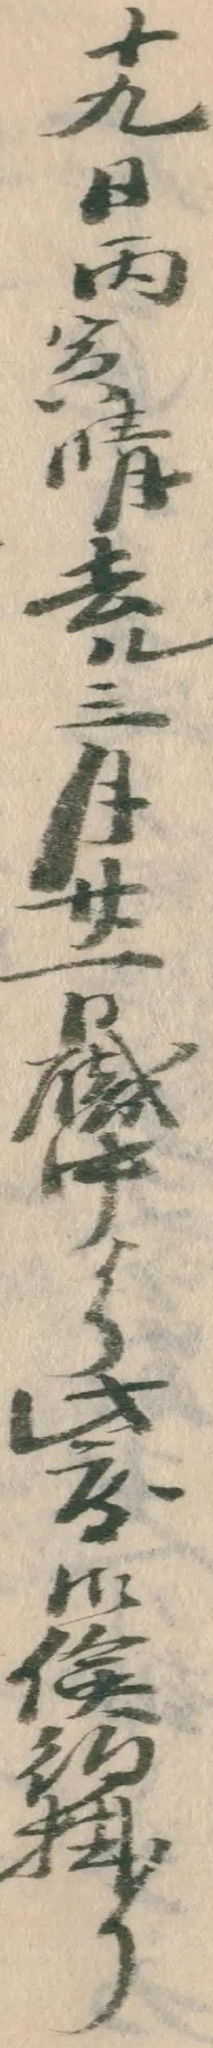十九日丙寅晴去ル三月廿一日職中より此度御倹約掛り
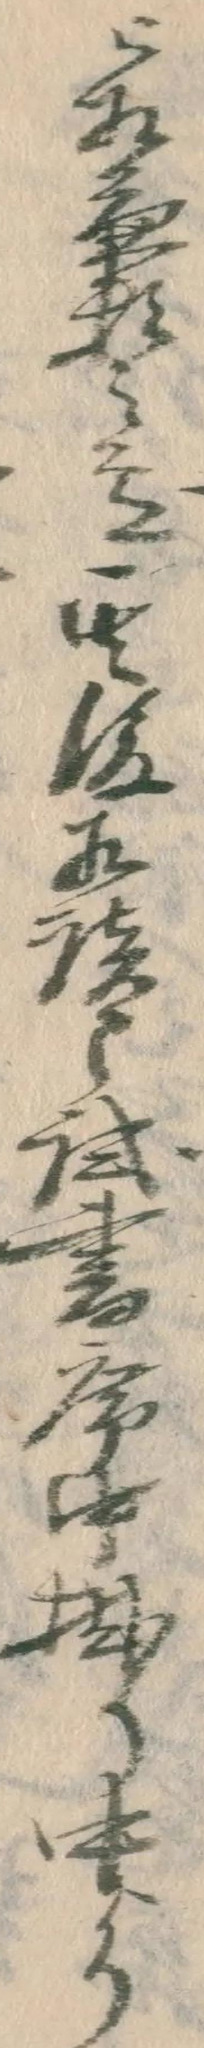被相兼頼之處其後相談申試書席中掛り中より
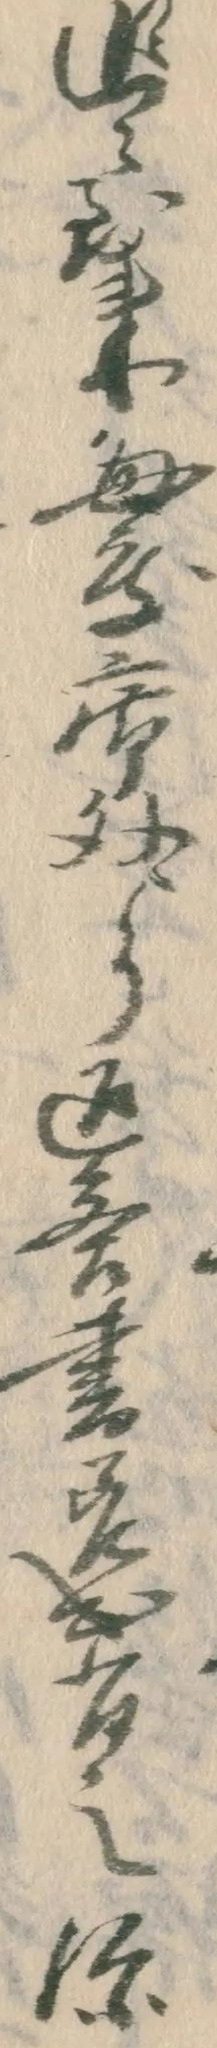追々到来毎度席外より返答書差出有之称
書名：賀茂社記録. 第67冊
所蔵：国立国会図書館 National Diet Library, JAPAN
